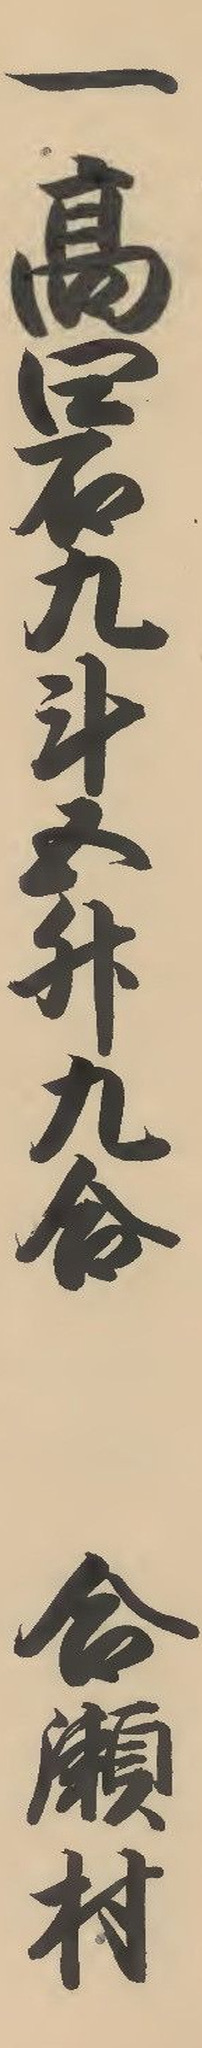一髙四石九斗五升九合合瀬村
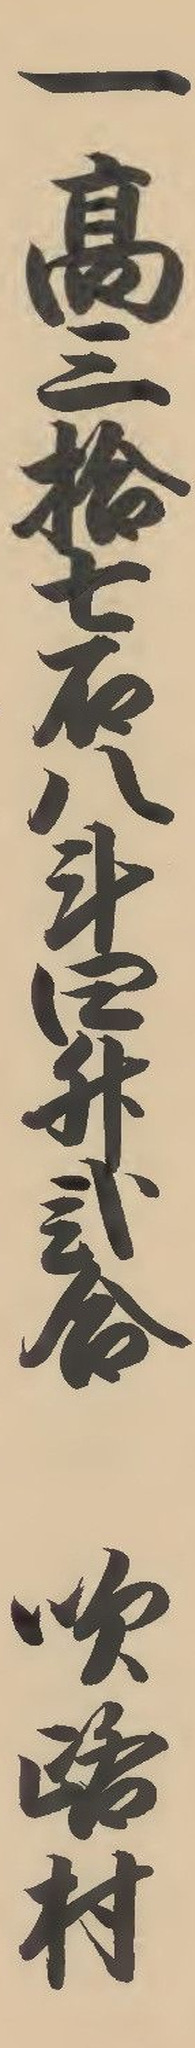一髙三拾七石八斗四升弐合吹路村
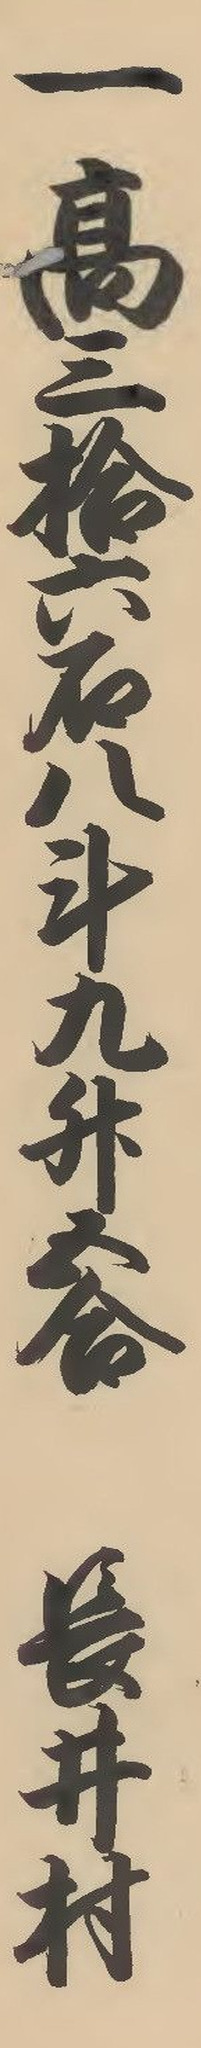一髙三拾六石八斗九升五合長井村

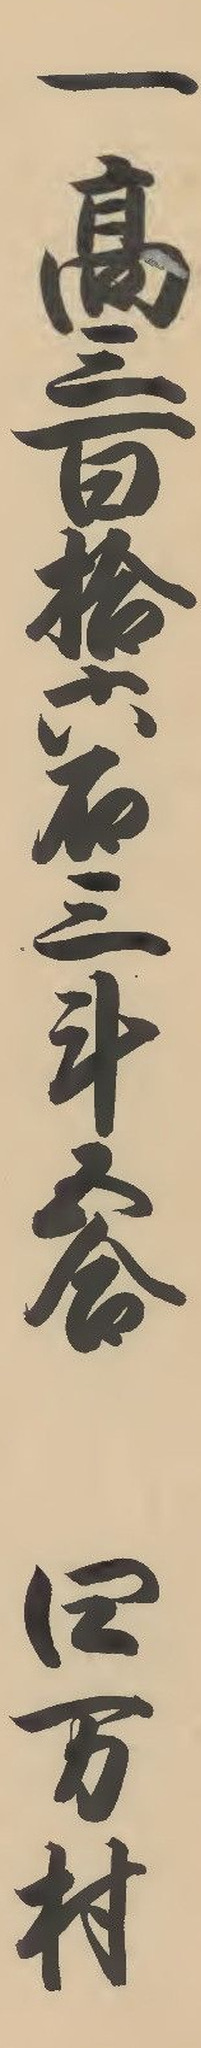一髙三百拾六石三斗五合四万村
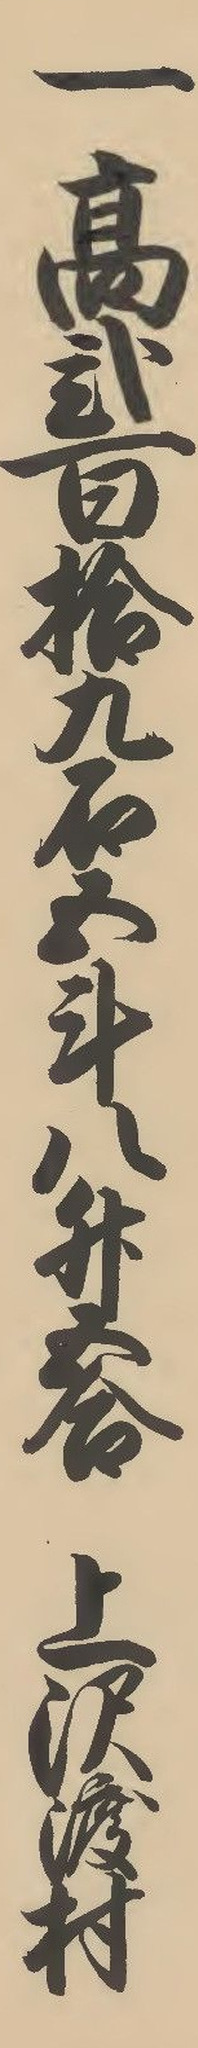一髙弐百拾九石五斗八升五合上沢渡村
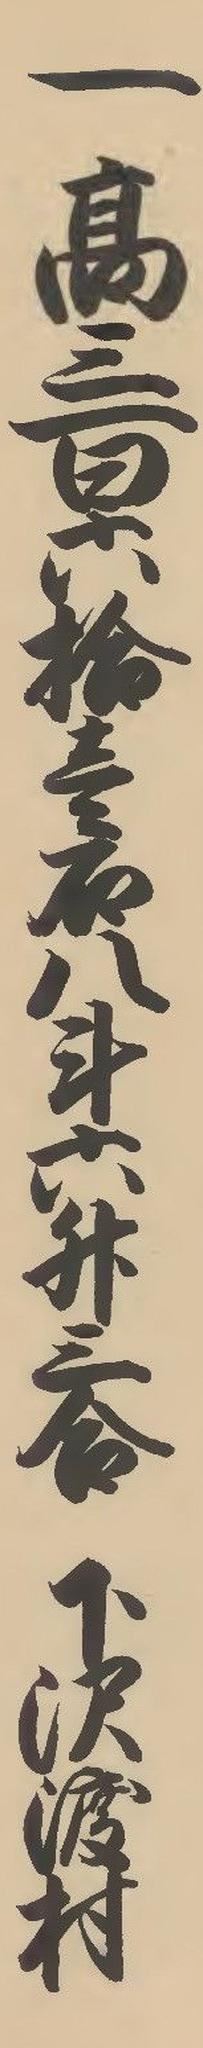一髙三百六拾壱石八斗六升三合下沢渡村
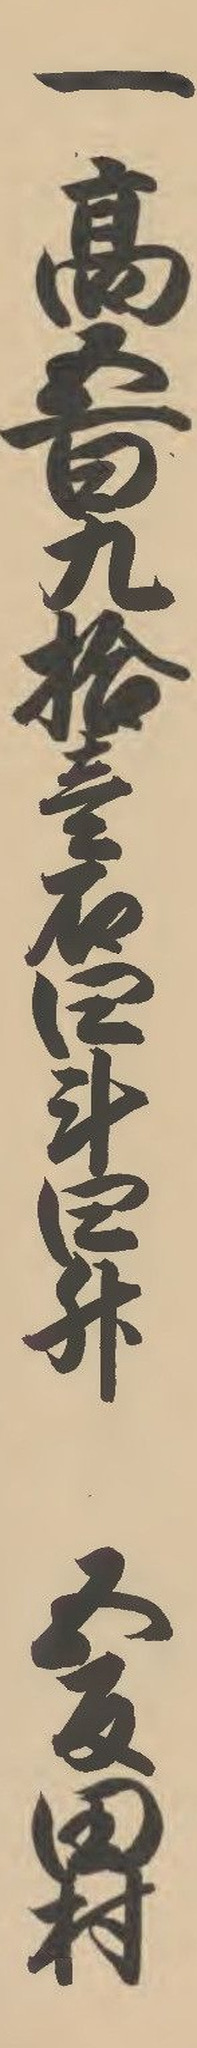一髙五百九拾壱石四斗四升五反田村
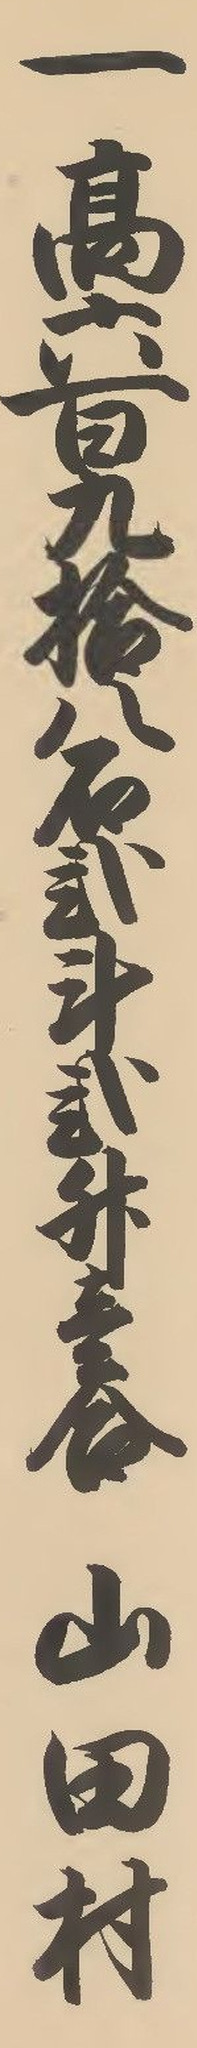一髙六百九拾八石弐斗弐升壱合山田村
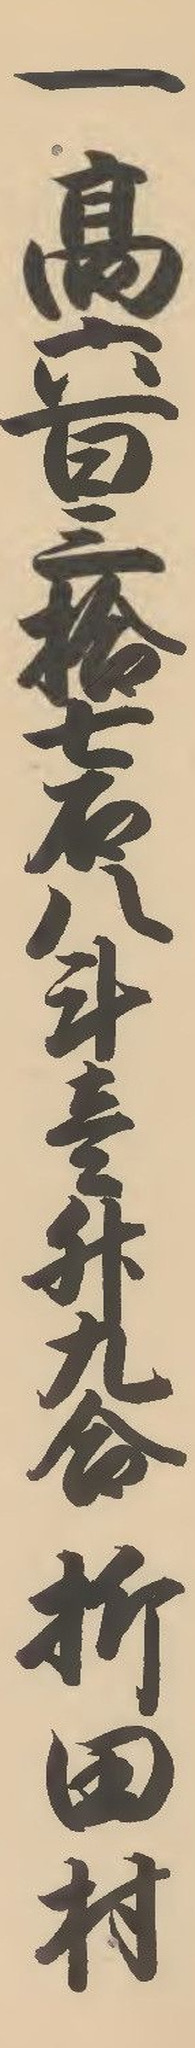一髙六百三拾七石八斗壱升九合折田村
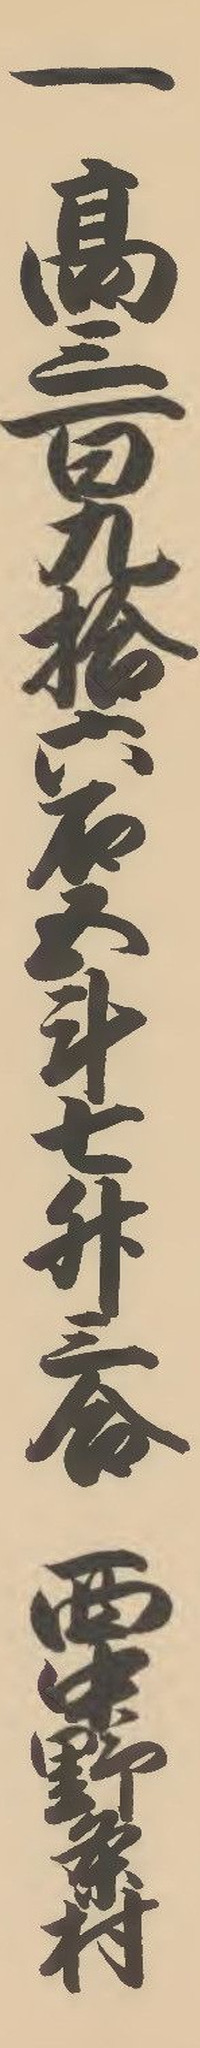一髙三百九拾六石五斗七升三合西中野条村
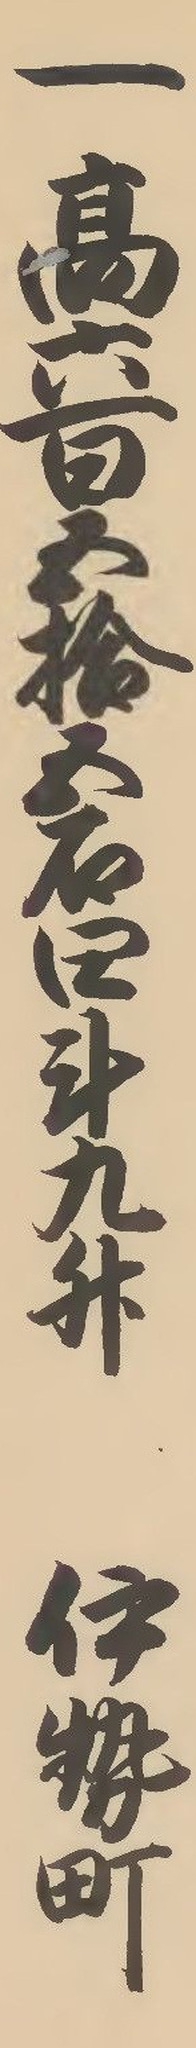一髙六百五拾五石四斗九升伊勢町

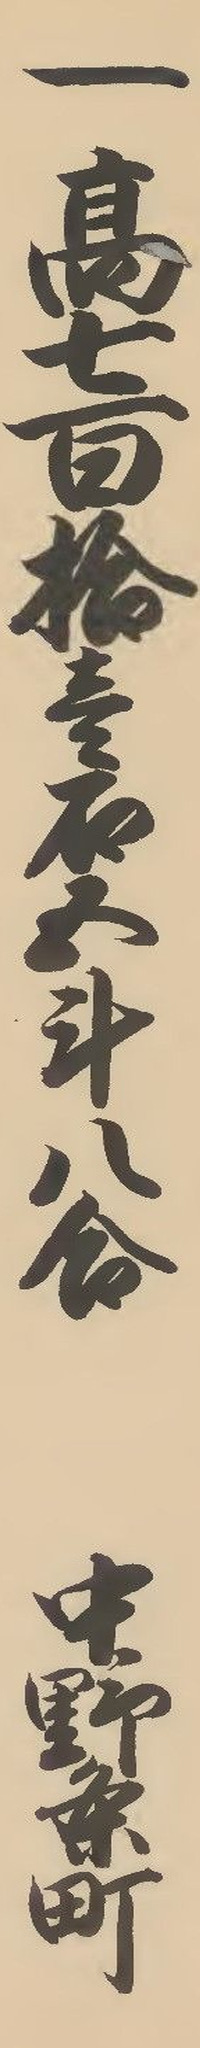一髙七百拾壱石五斗八合中野条町
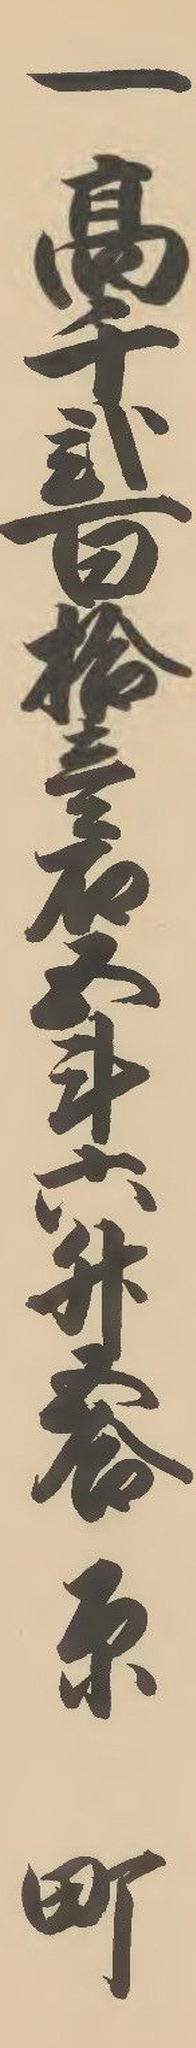一髙千弐百拾壱石五斗六升五合原町
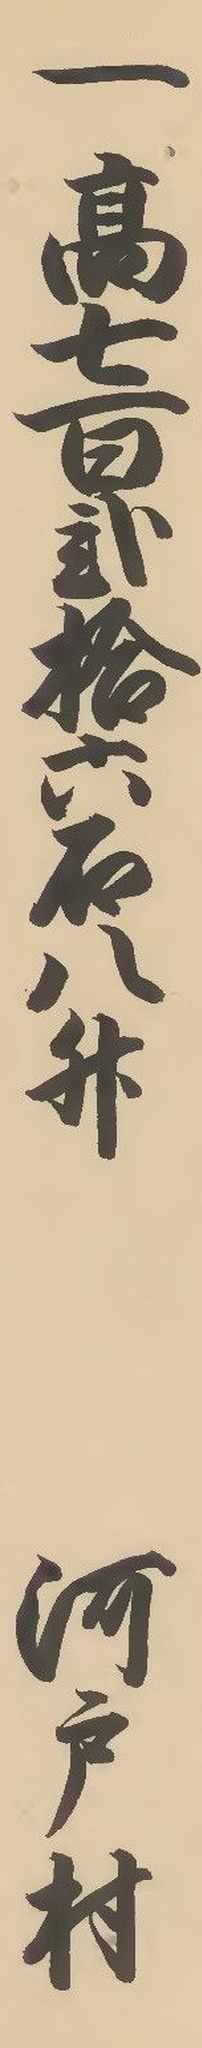一髙七百弐拾六石八升河戸村
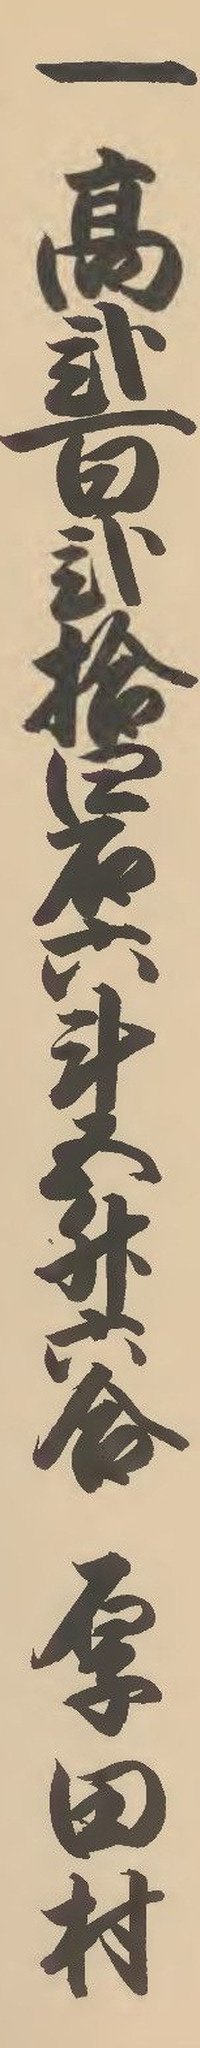一髙弐百弐拾四石六斗五升六合厚田村
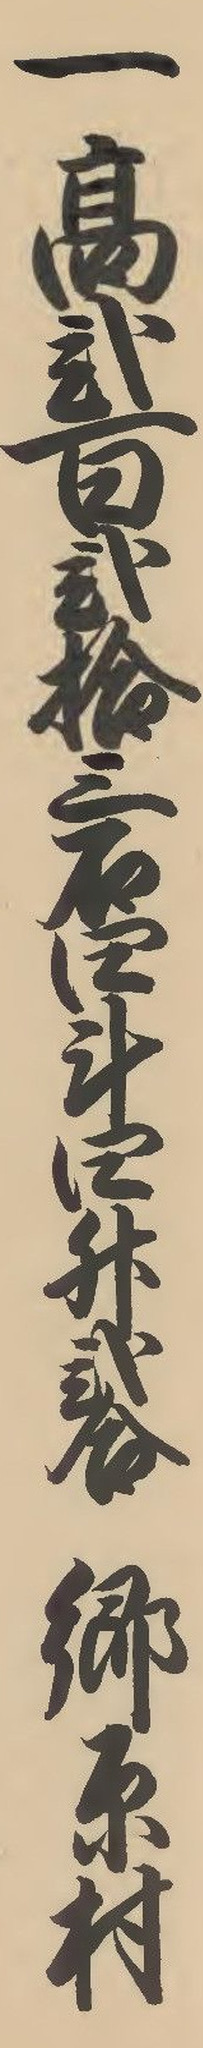一髙弐百弐拾三石四斗四升弐合郷原村
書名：上野国郷帳
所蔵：国立公文書館 National Archives of Japan
